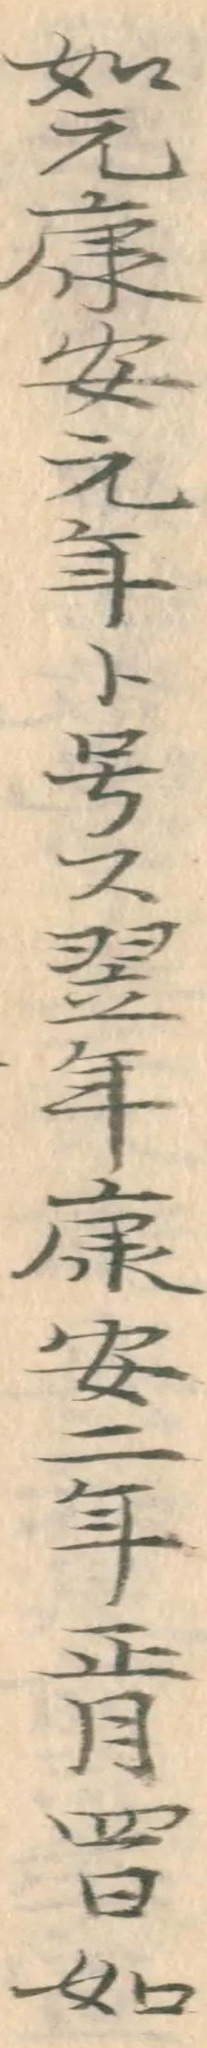如元康安元年ト号ス翌年康安二年正月四日如
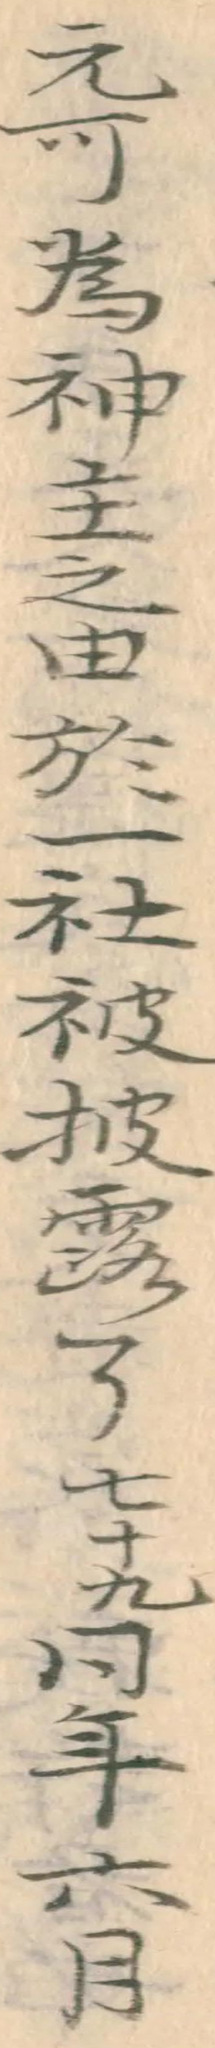元可為神主之由於一社被披露了七十九同年六月
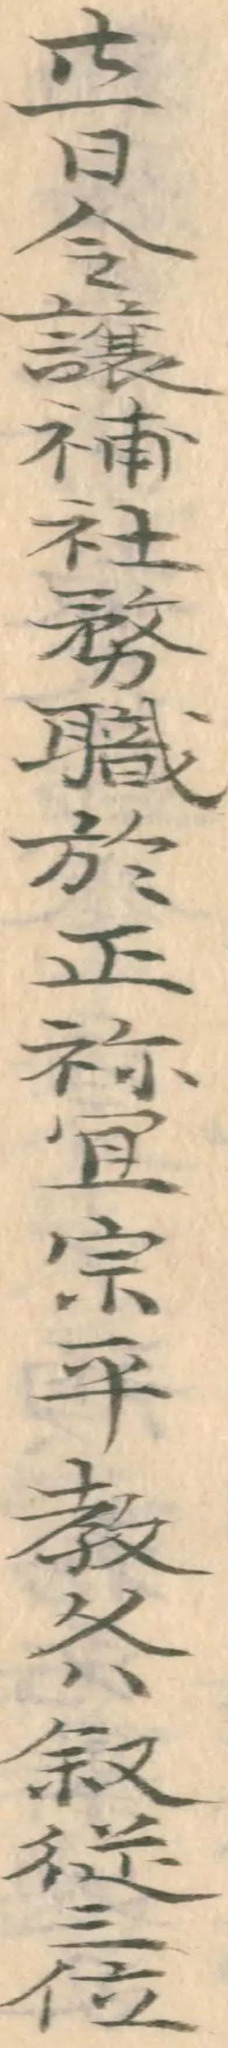廿一日令譲補社務職於正祢宜宗平教久ハ叙従三位
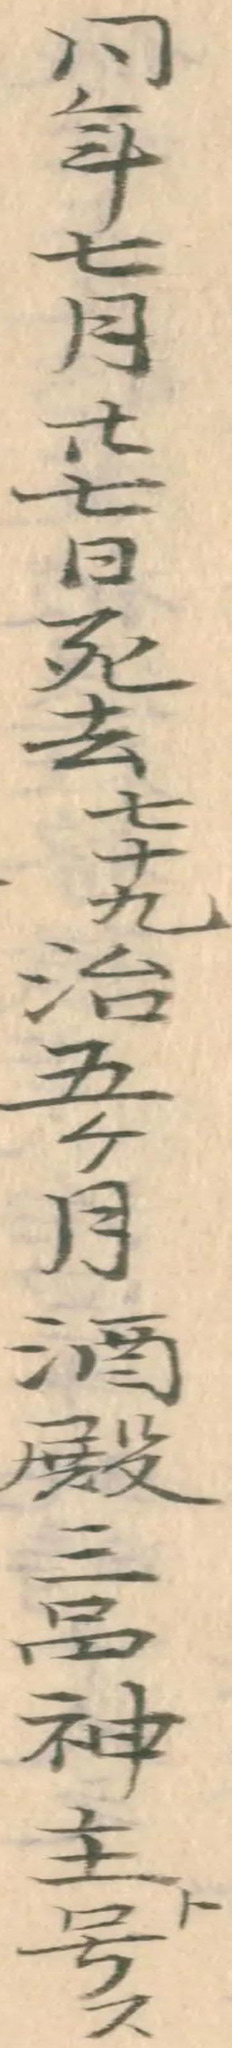同年七月廿七日死去七十九治五ケ月酒殿三品神主ト号ス
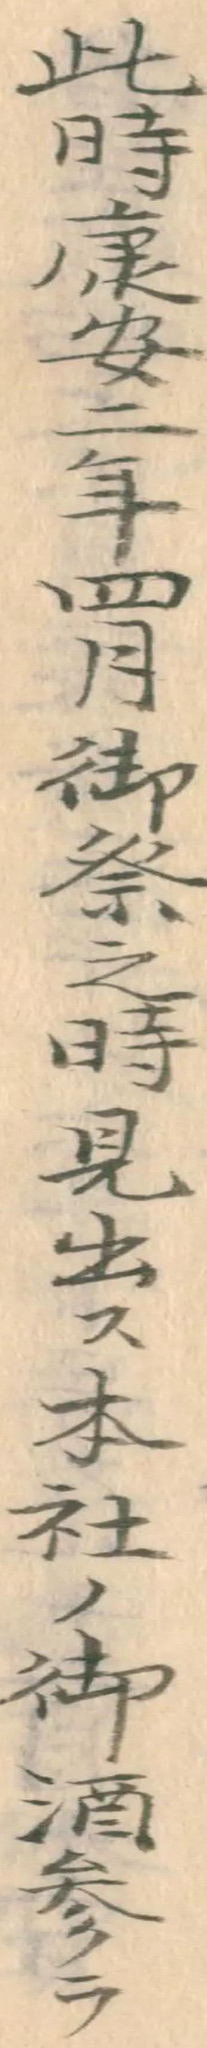此時康安二年四月御祭之時見出ス本社ノ御酒参ラ
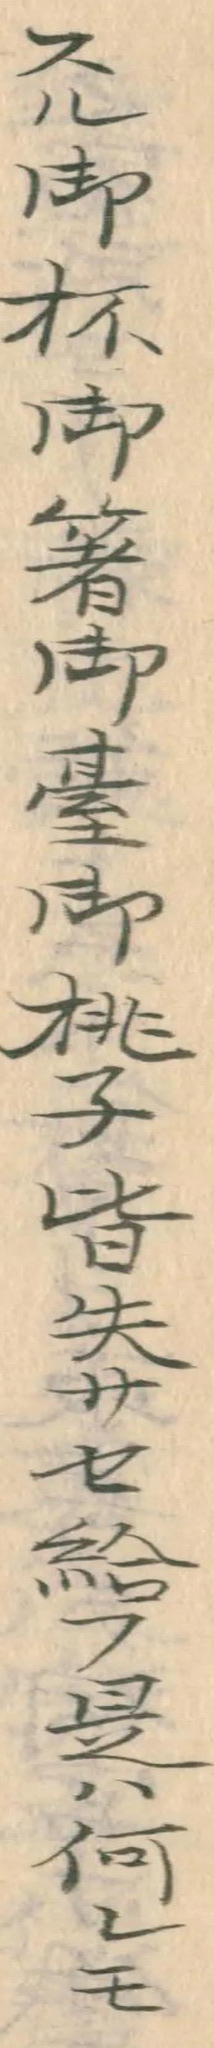スル御杯御箸御台御桃子皆失サセ給フ是ハ何レモ
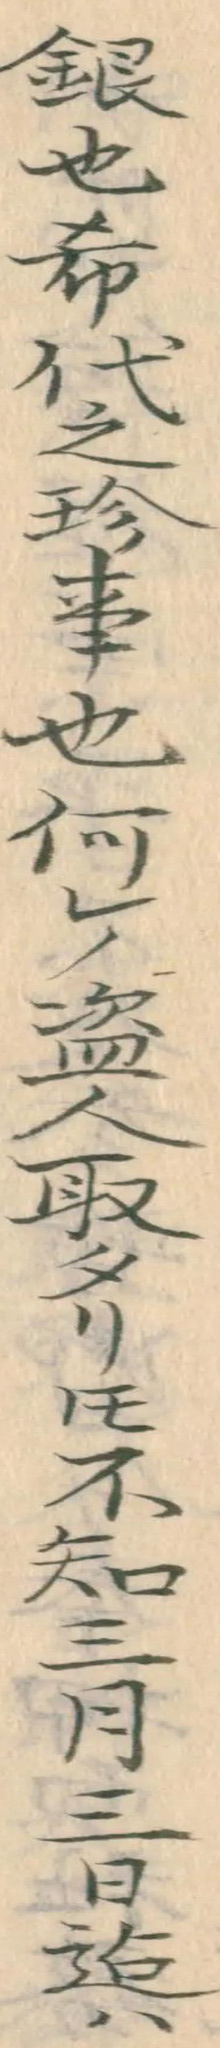銀也希代之珍事也何レノ盗人取タリトモ不知三月三日迄ハ
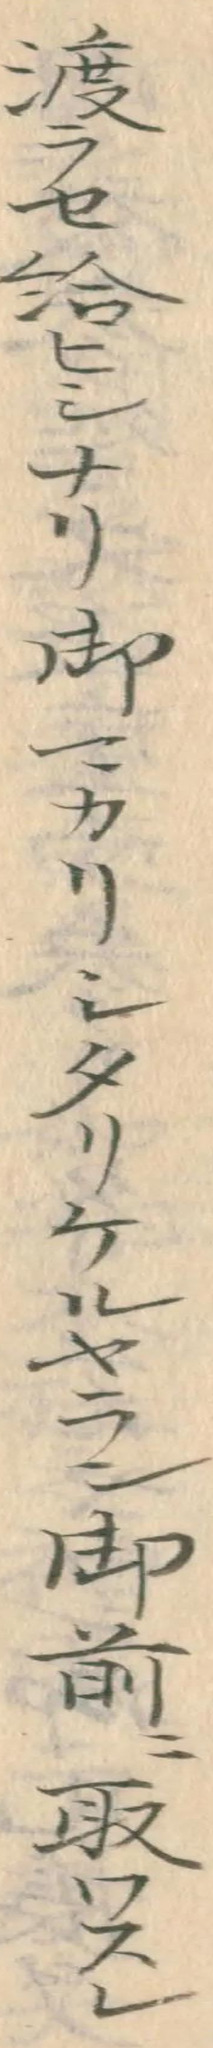渡ラセ給ヒシナリ御マカリシタリケルヤラン御前ニ取ワスレ
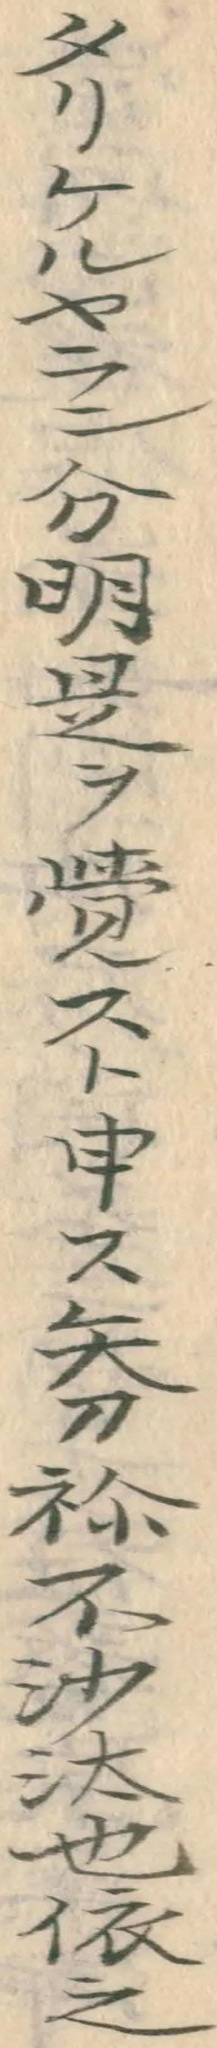タリケルヤラン分明是ヲ覚スト申ス矢刀祢不沙汰也依之
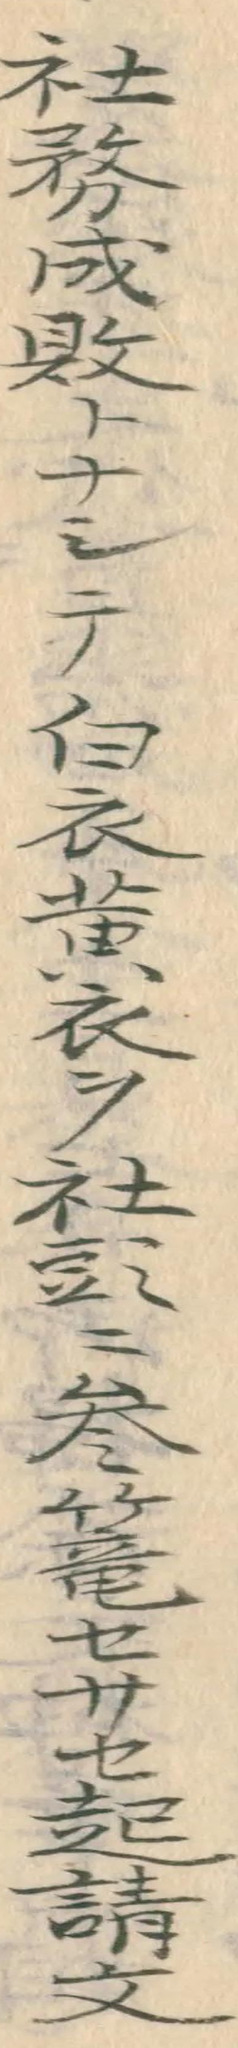社務成敗トナシテ白衣黄衣ヲ社頭ニ参籠セサセ起請文
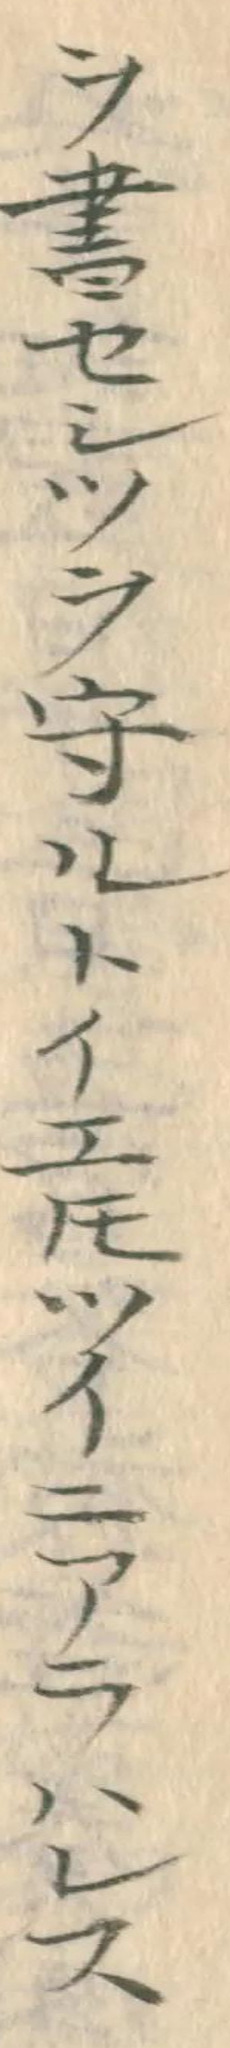ヲ書セシツヲ守ルトイエトモツイニアラハレス
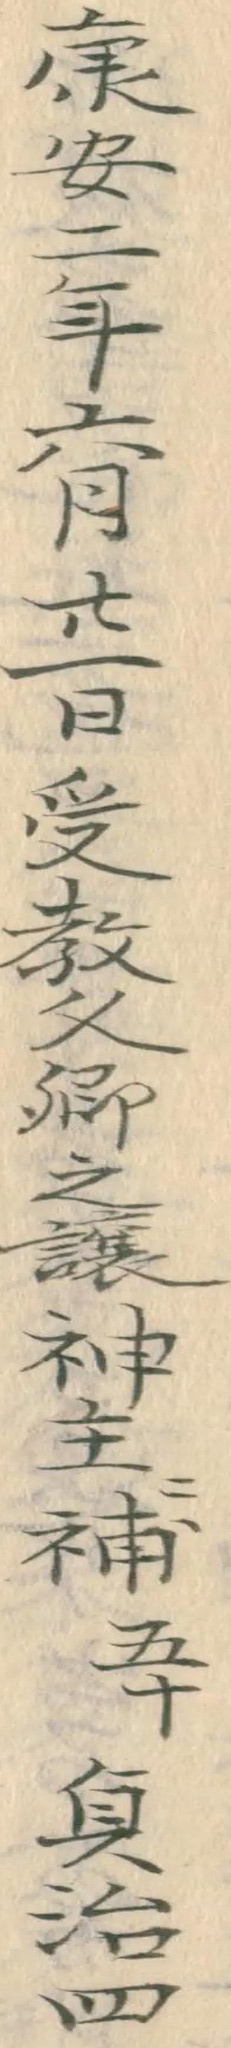康安二年六月廿一日受教久卿之譲神主ニ補五十貞治四
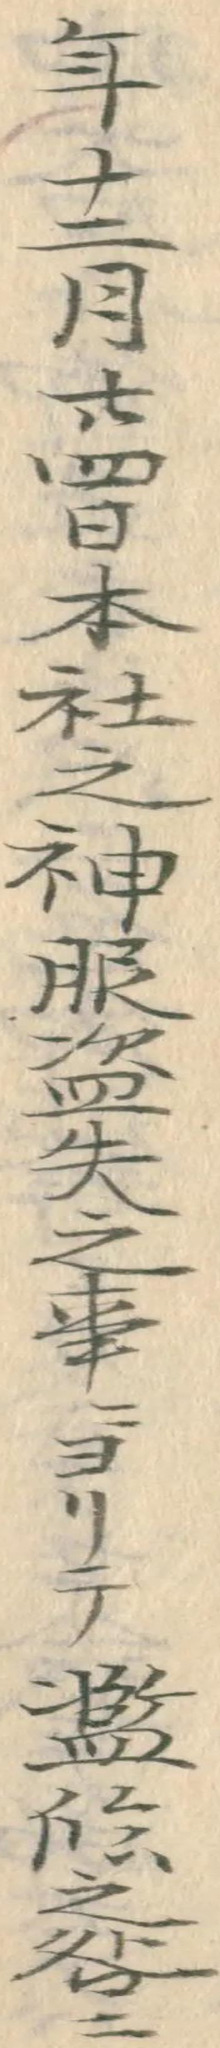年十二月廿四日本社之神服盗失之事ニヨリテ濫臨之咎ニ
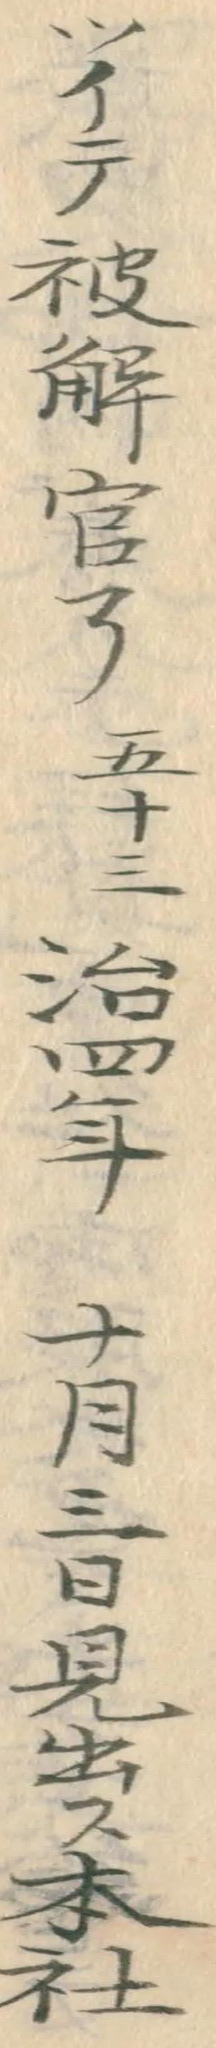ツイテ被解官了五十三治四年十月三日見出ス本社
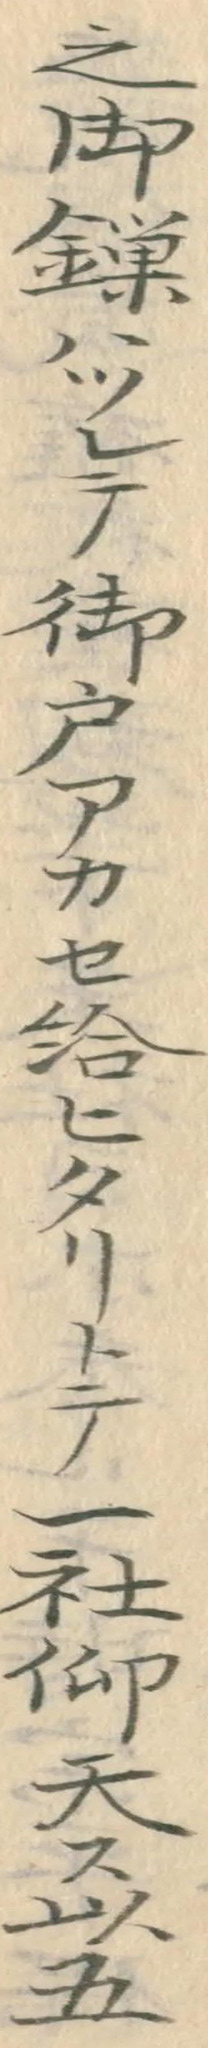之御鏁ハツレテ御戸アカセ給ヒタリトテ一社仰天ス以五
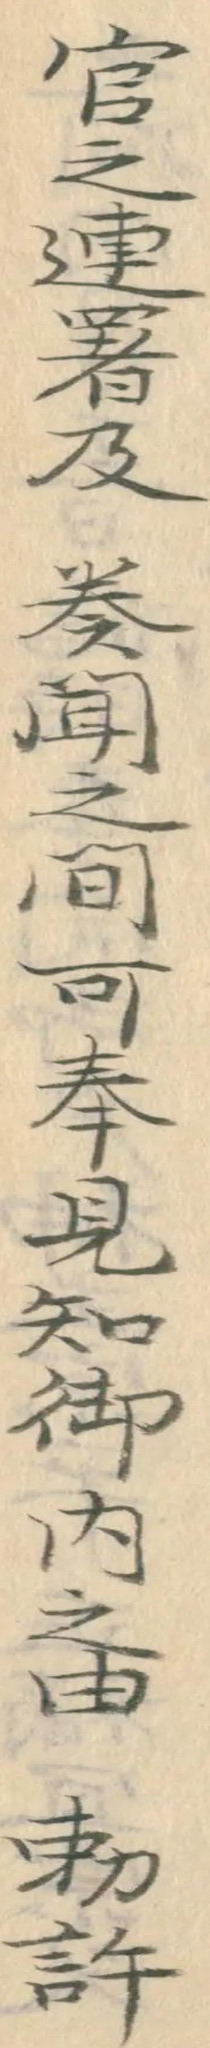官之連署及奏聞之間可奉見知御内之由勅許
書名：賀茂社記録. 第24冊
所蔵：国立国会図書館 National Diet Library, JAPAN
